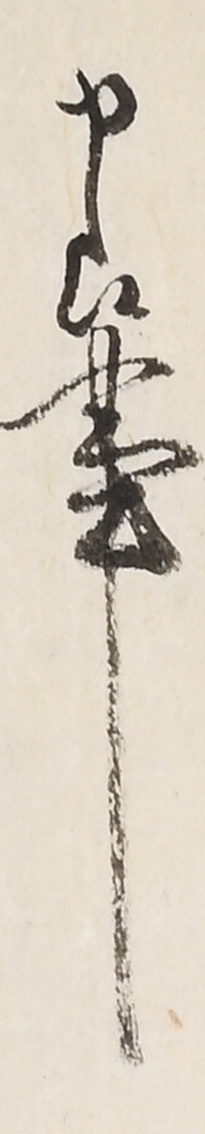申候事
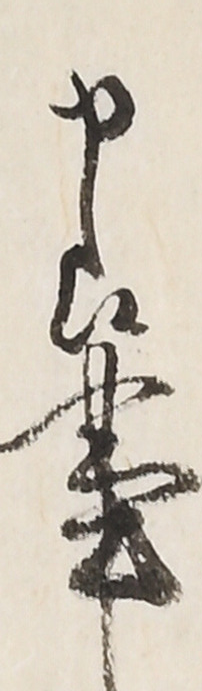申候事

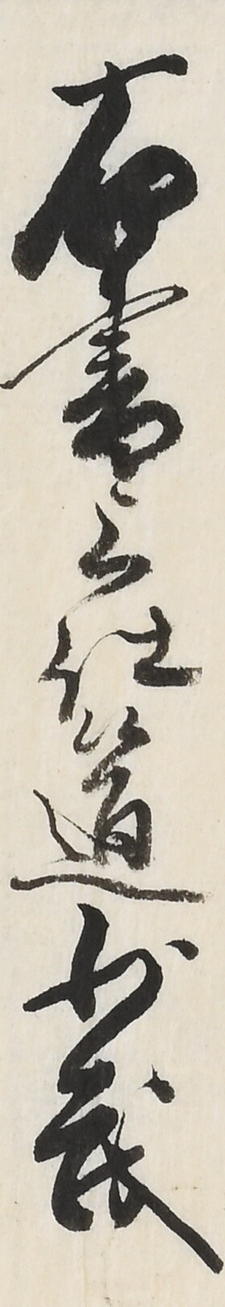右書上仕候通少も
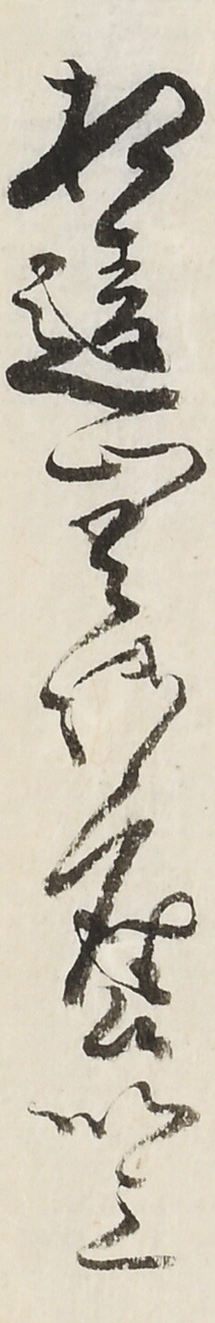相違無御座候以上
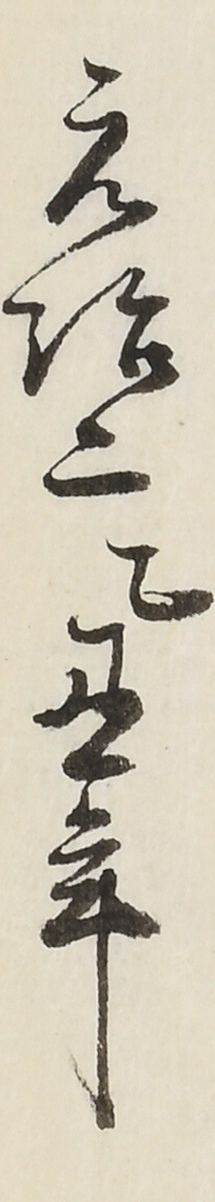元治二乙丑年

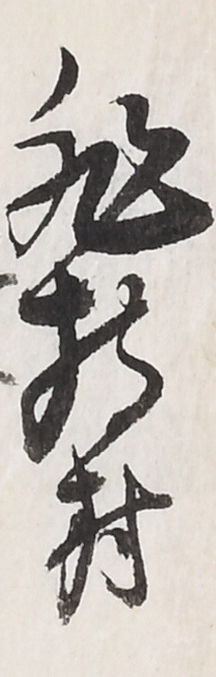非持村
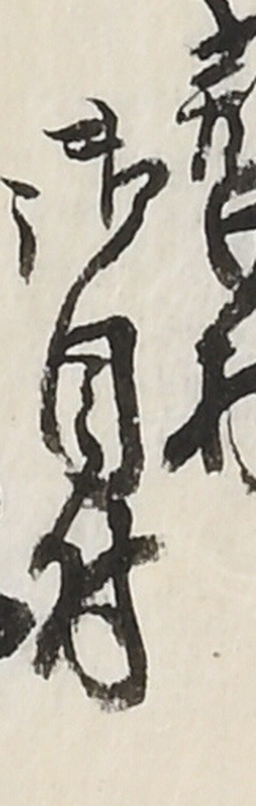御目付
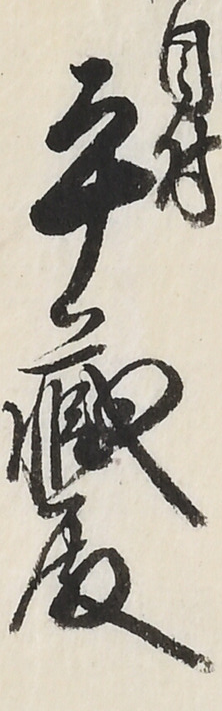平蔵殿
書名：元治二乙丑年二月石切名前書上帳
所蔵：伊那市立高遠町図書館・合同会社AMANE
